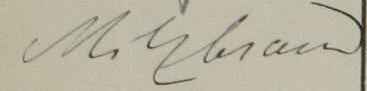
Milzbrand
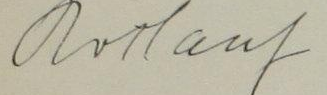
Rotlauf
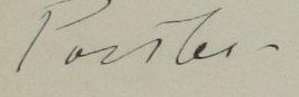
Postbe.
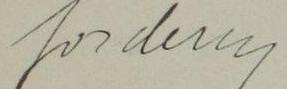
förderung
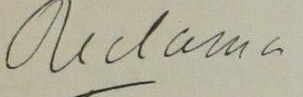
Reclama
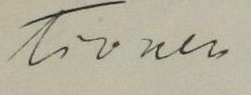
tionen
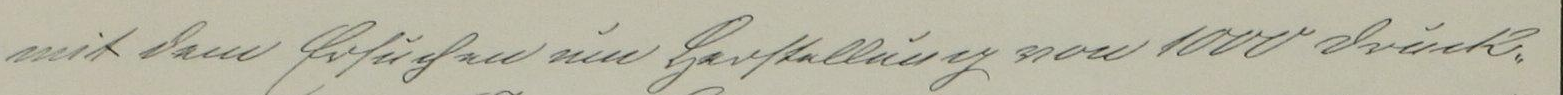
mit dem Ersuchen um Herstellung von 1000 Druck-
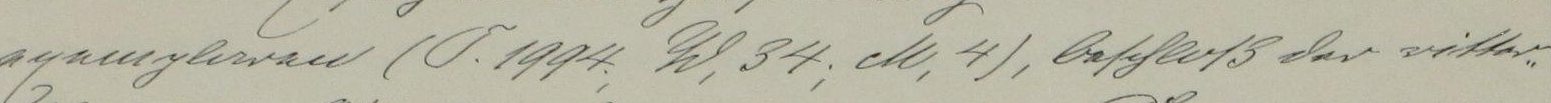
exemplaren (T.1994; W.34, M.4), beschloß der ritter-
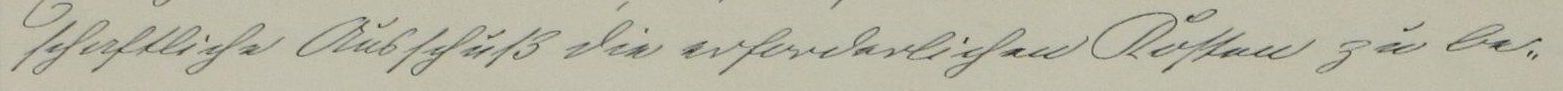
schaftliche Ausschuß die erforderlichen Kosten zu be-
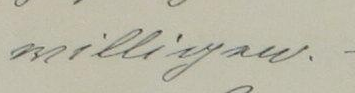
willigen.
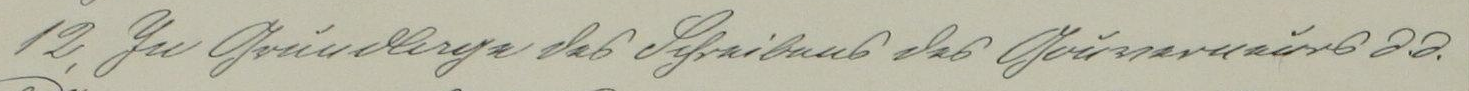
12. In Grundlage des Schreibens des Gouverneurs d.d.
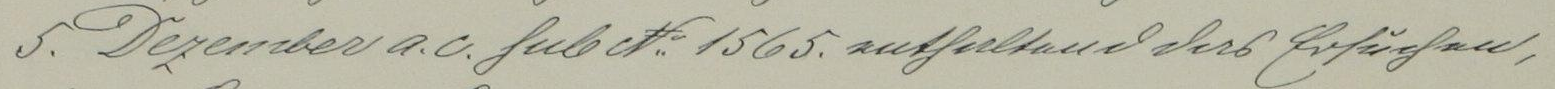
5. Dezember a.c. sub No. 1565, enthaltend das Ersuchen,
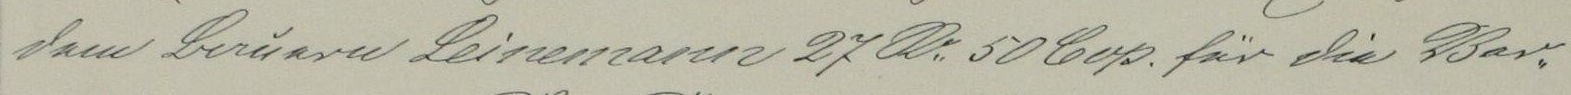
dem Bauern Leinemann 27 Ro. 50 Cop. für die Ver-
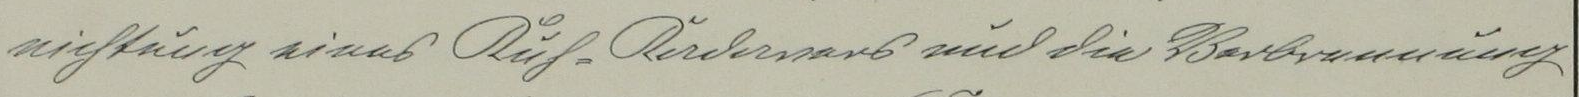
nichtung eines Kuh-Kadavers und die Verbrennung
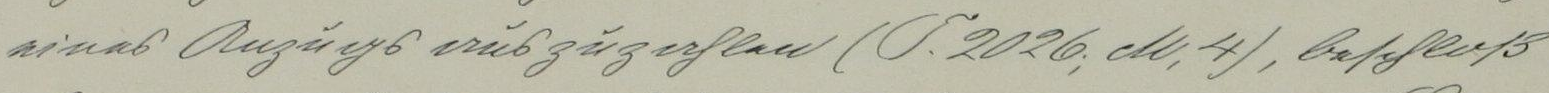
eines Anzugs auszuzahlen (T.2026; M.4), beschloß
